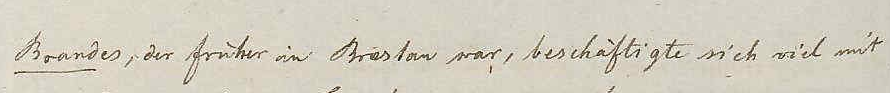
Brandes, der früher in Breslau war, beschäftigte sich viel mit
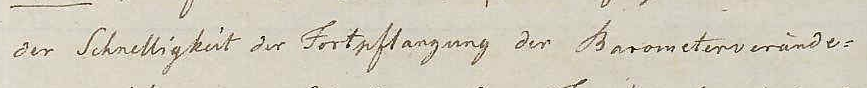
der Schnelligkeit der Fortpflanzung der Barometerverände-
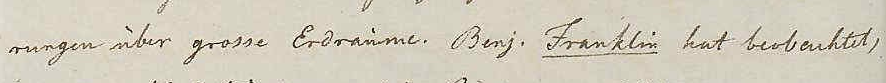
rungen über grosse Erdräume. Benj. Franklin hat beobachtet,
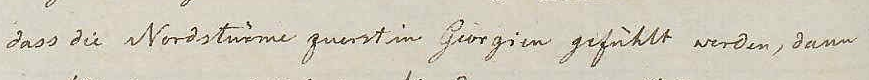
dass die Nordstürme zuerst in Georgien gefühlt werden, dann
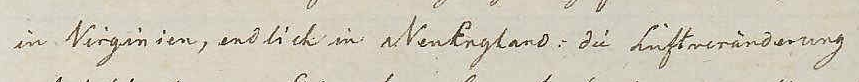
in Virginien, endlich in NeuEngland: die Luftveränderung
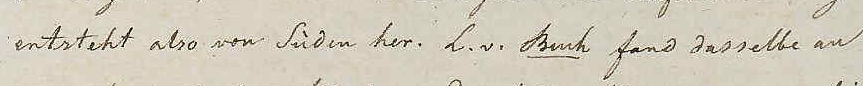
entsteht also von Süden her. L. v. Buch fand dasselbe an
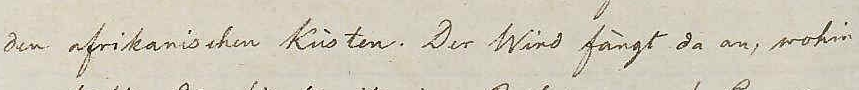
den afrikanischen Küsten. Der Wind fängt da an, wohin
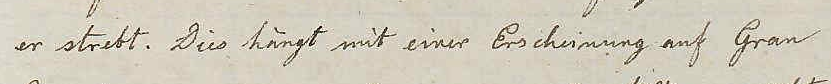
er strebt. Dies hängt mit einer Erscheinung auf Gran
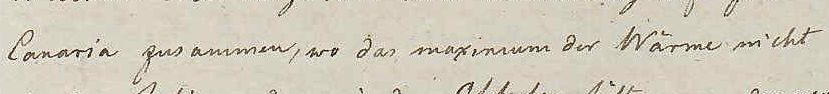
Canaria zusammen, wo das maximum der Wärme nicht
